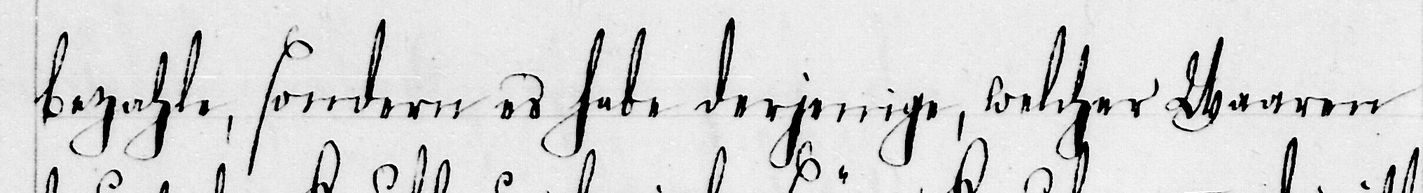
bezahle, sondern es habe derjenige, welcher Waaren
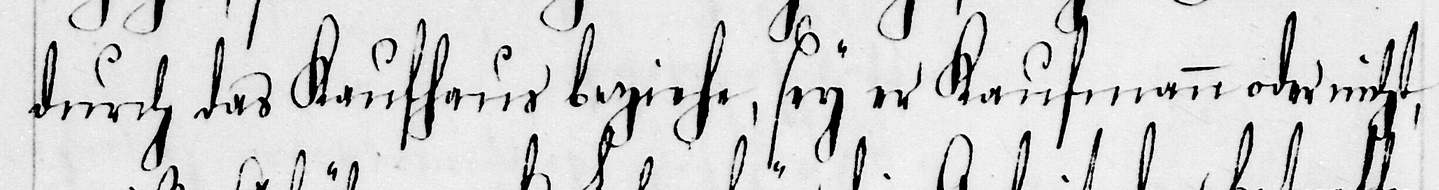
durch das Kaufhaus beziehe, sey er Kaufmann oder nic¬
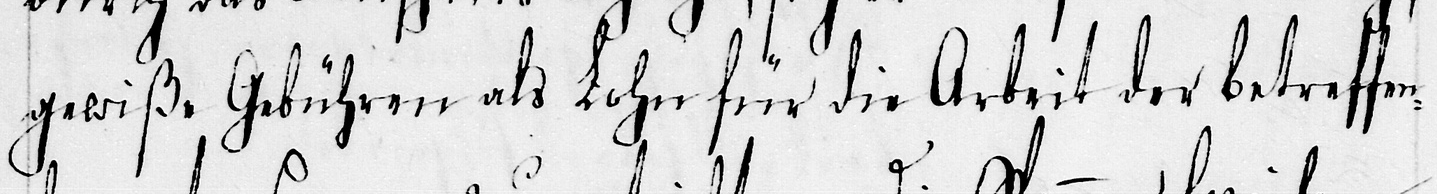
gewiße Gebühren als Lohn für die Arbeit der betreff¬
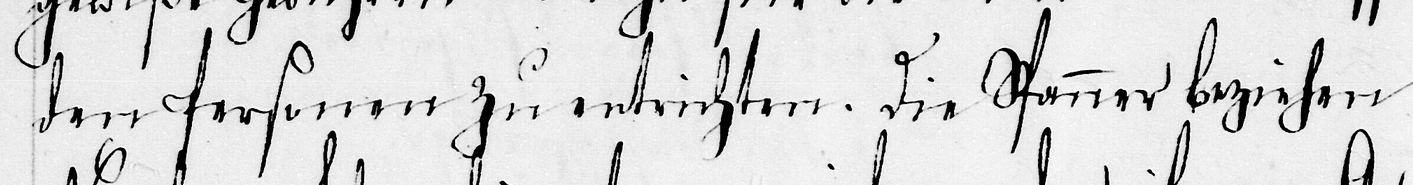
den Personen zu entrichten. Die Spanner beziehen
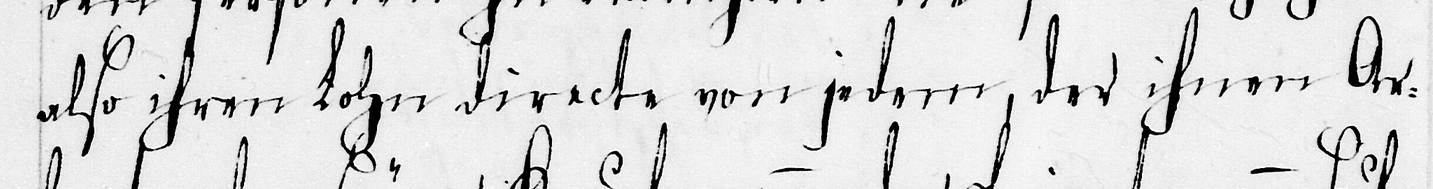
also ihren Lohn directe von jedem der ihnen Ar¬
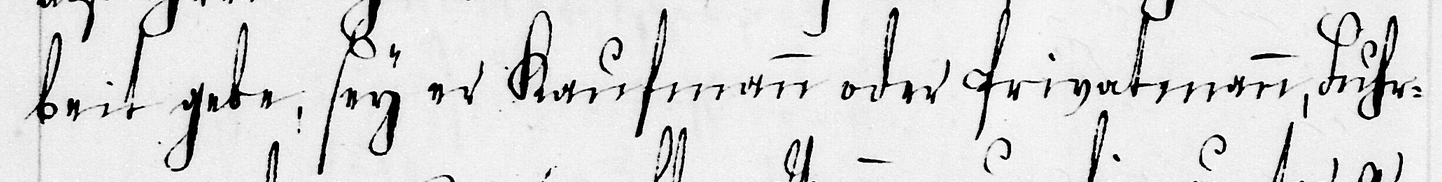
beit gebe, sey er Kaufmann oder Privatmann, Fuhr¬
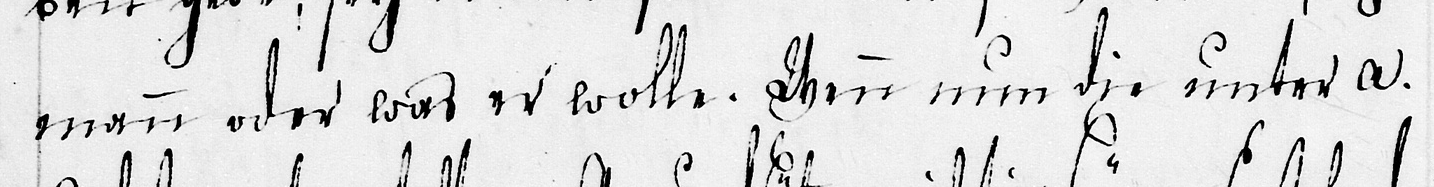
mann oder was er wolle. Wenn nun die unter a.
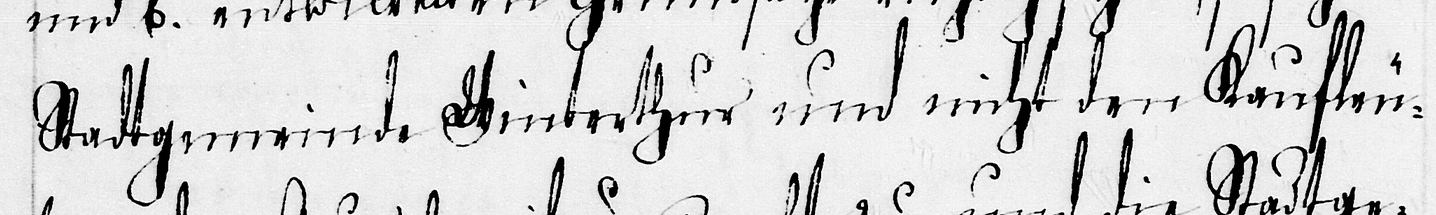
Stadtgemeinde Winterthur und nicht den Kaufleu¬
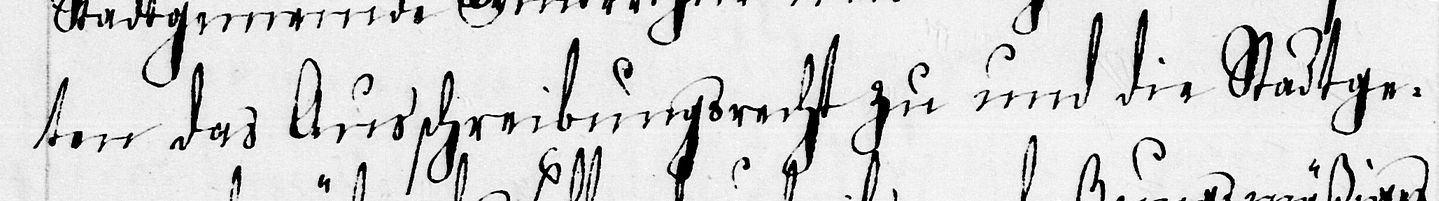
ten das Ausschreibungsrecht zu und die Stadtge¬
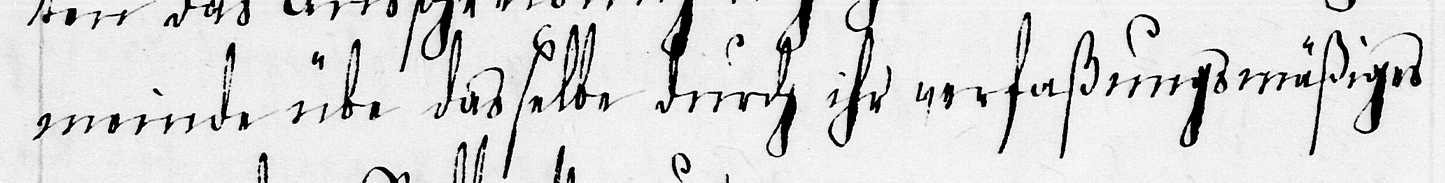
meinde übe dasselbe durch ihr verfaßungsmäßiges
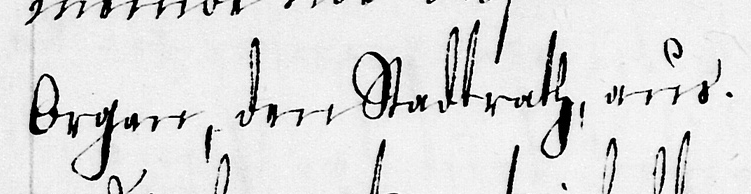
Organ, den Stadtrath, aus.
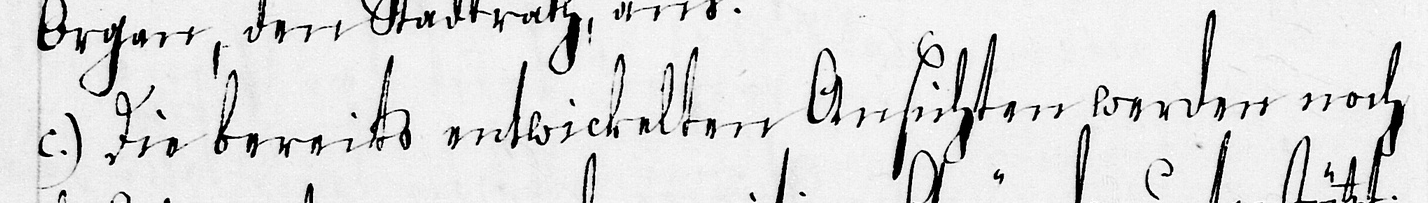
c.) Die bereits entwickelten Ansichten werden noch
